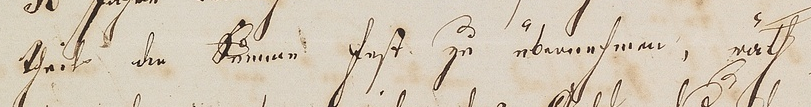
Theil der Summe fest zu übernehmen, räth
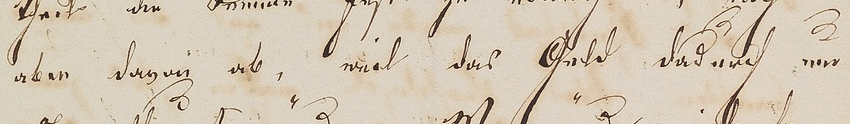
aber davon ab, weil das Geld dadurch nur
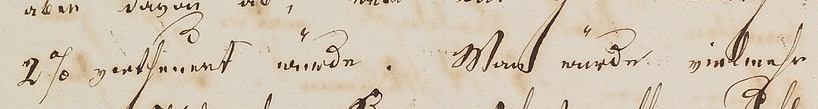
2% vertheuert würde. Man würde vielmehr
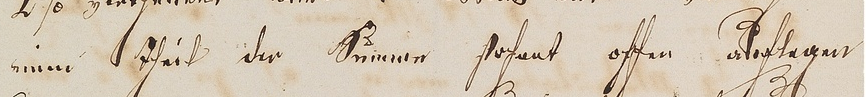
einen Theil der Summe sofort offen auflegen
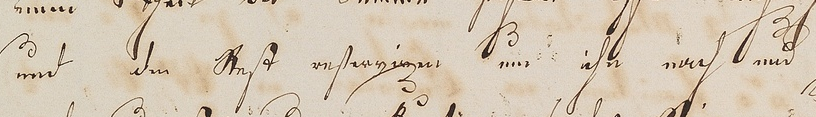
und den Rest reserviren um ihn nach und
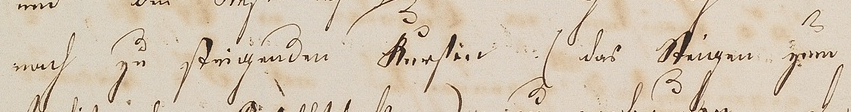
nach zu steigenden Kursen (das Steigen zum
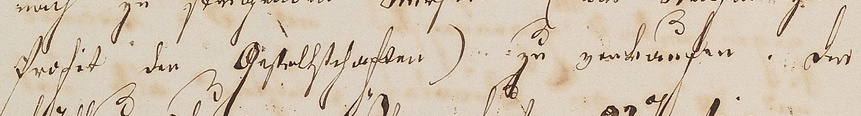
Profit der Gesellschaften) zu verkaufen. Der
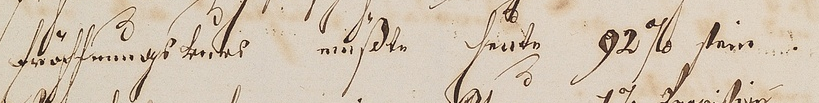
Eröffnungskurs müßte heute 92% sein.
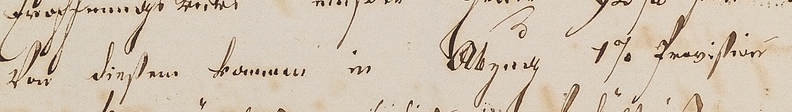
Von diesem kommen in Abzug 1% Provision,
